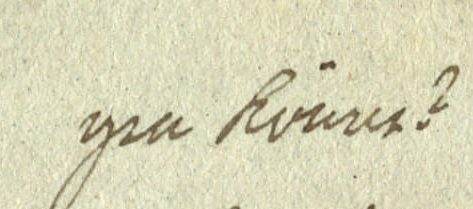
gen könne?
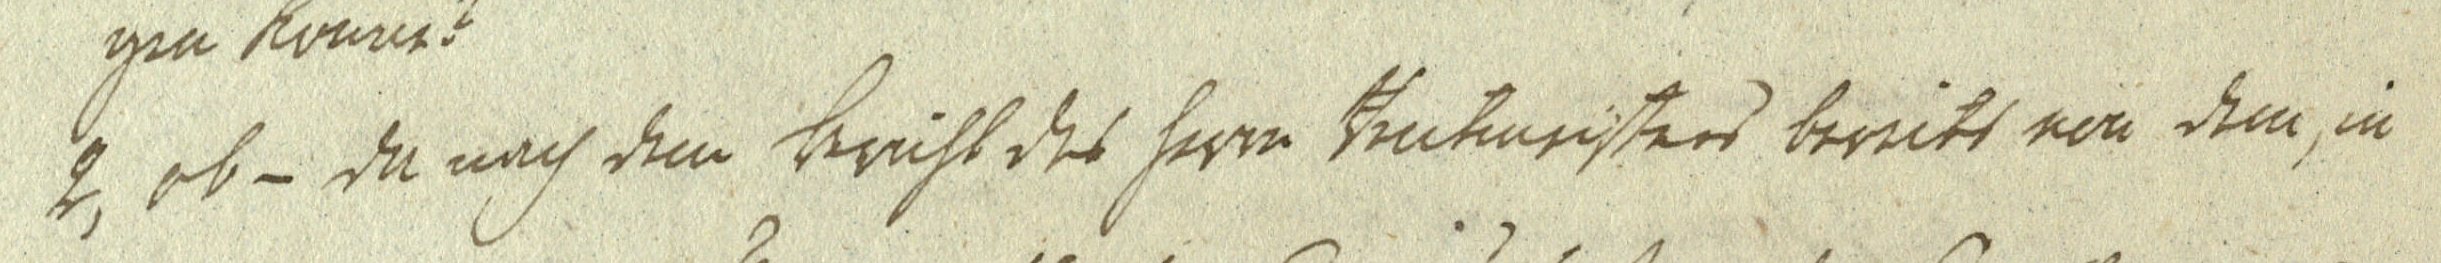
2, ob- da nach dem Bericht des Herrn Rentmeisters bereits von dem, in
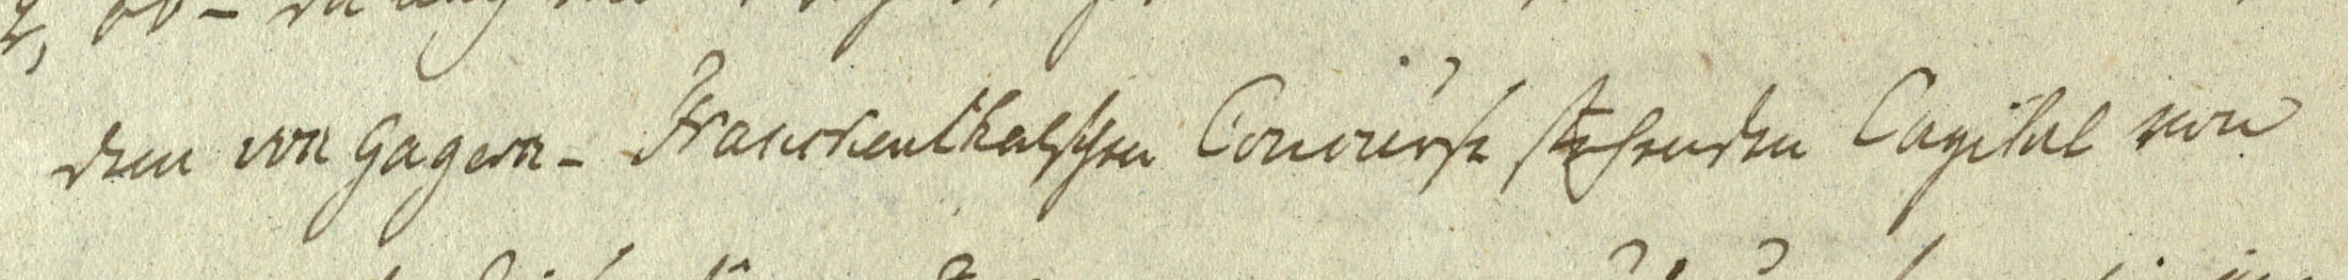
dem M Gagern - Franckenthalschen Concurse stehenden Capital von
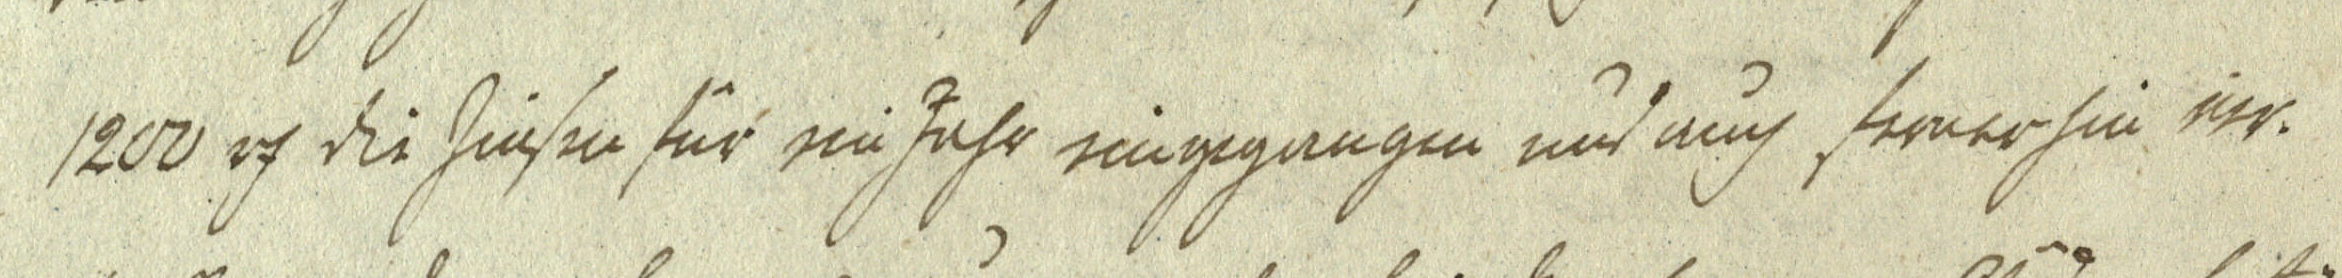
1200 rf die Zinsen für in Jahr eingegangen und auch fernerhin ver¬
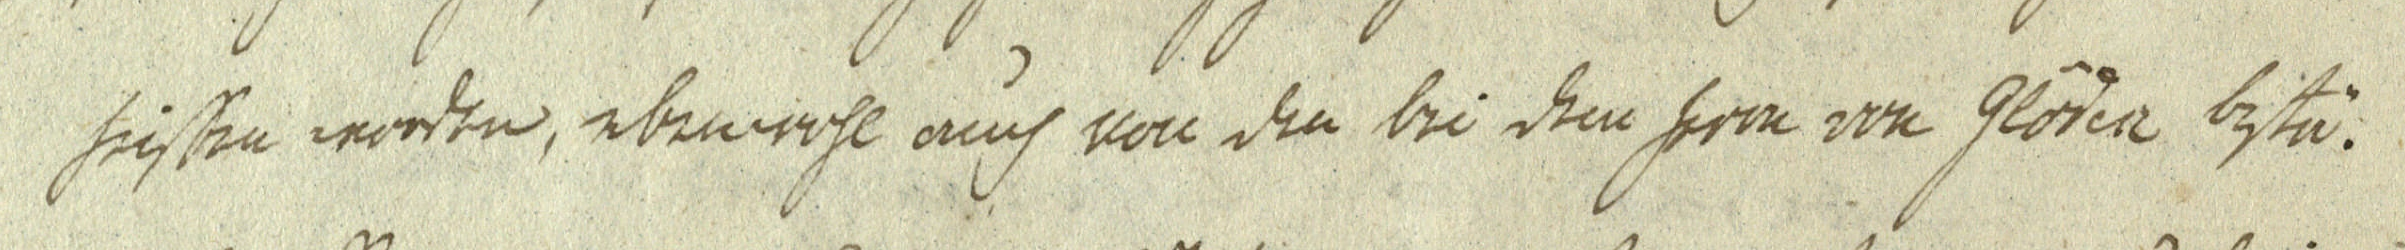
heissen worden, ebenwohl auch von den bei dem Herrn von Glöden bestä¬
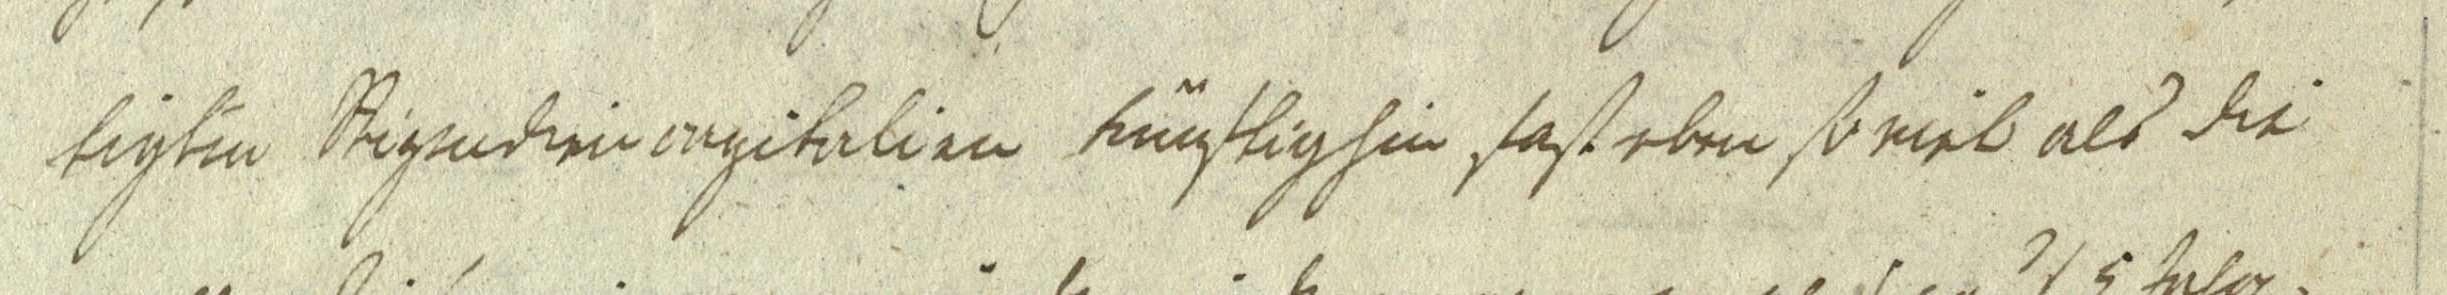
tigten Stipendiencapitalien künftighin fast eben so viel als die
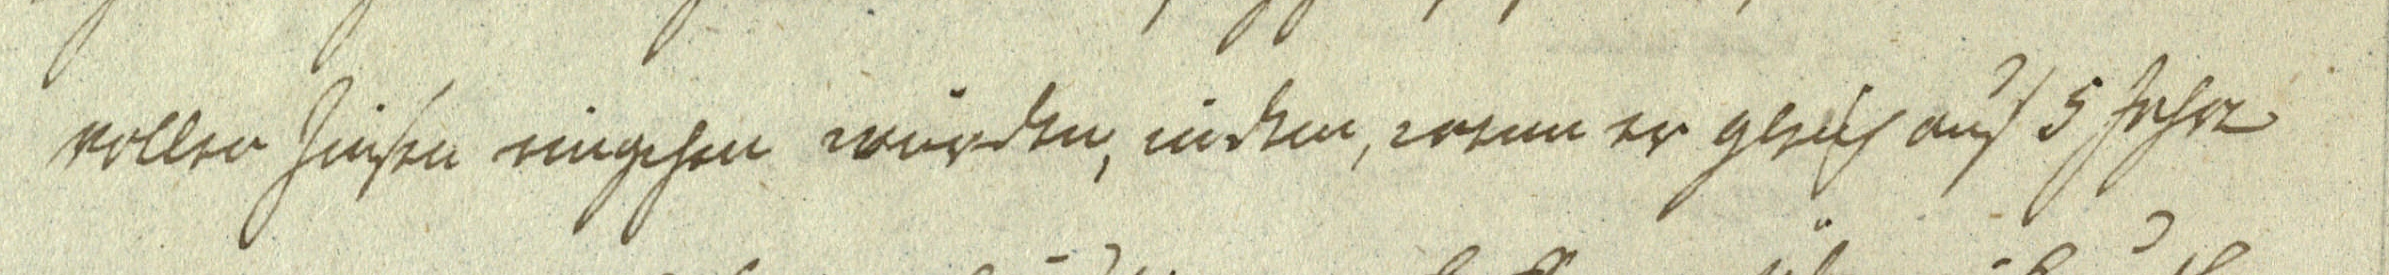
vollen Zinsen eingehen würden, indem, wenn er gleich auf 5 Jahre
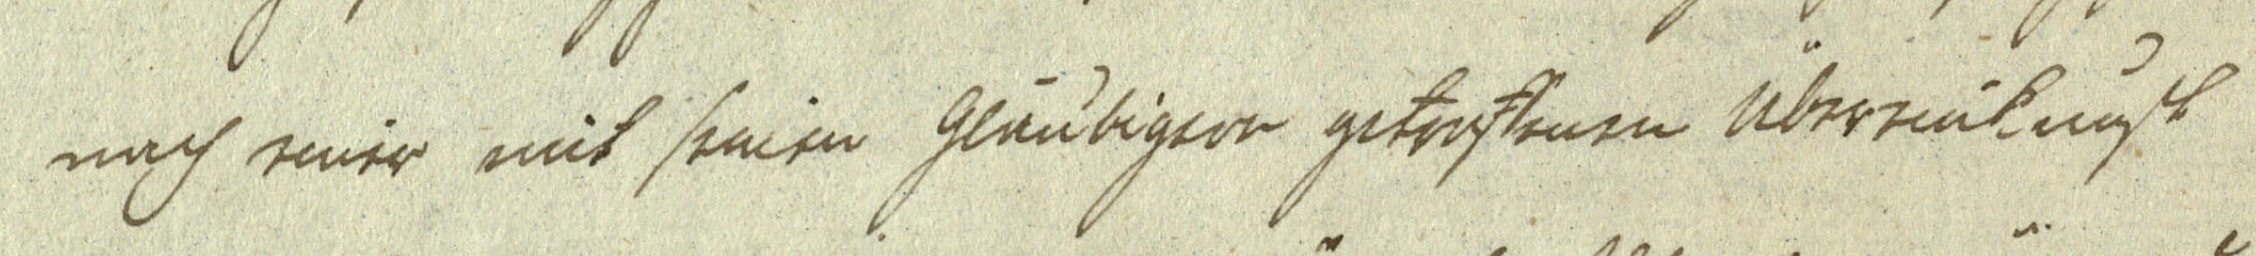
nach einer mit seinen Gläubigern getroffenen Übereinkunft
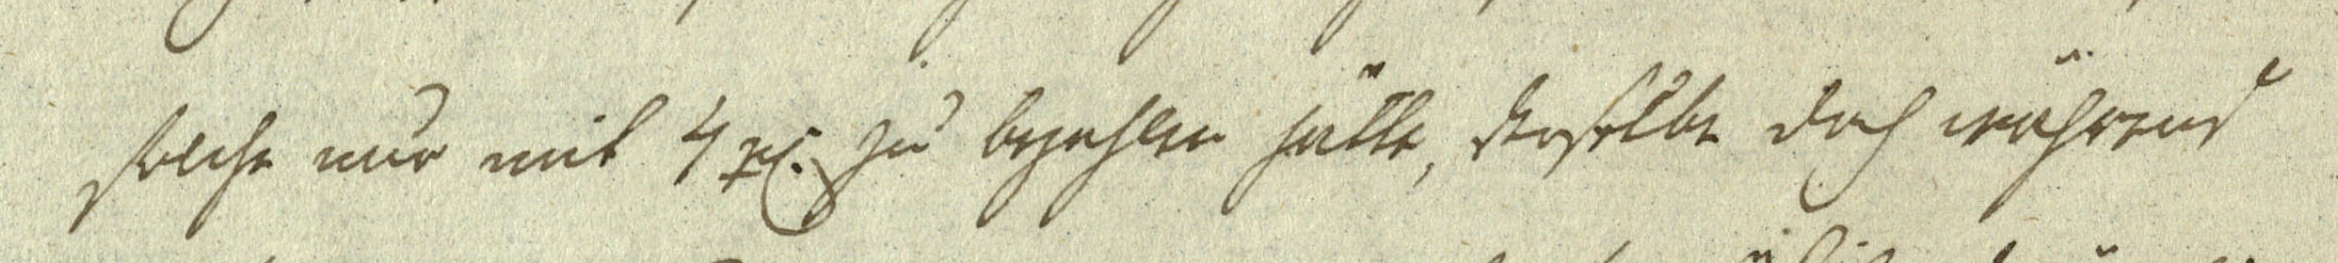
solche nur mit 4 pc zu bezahlen hätte, derselbe doch während
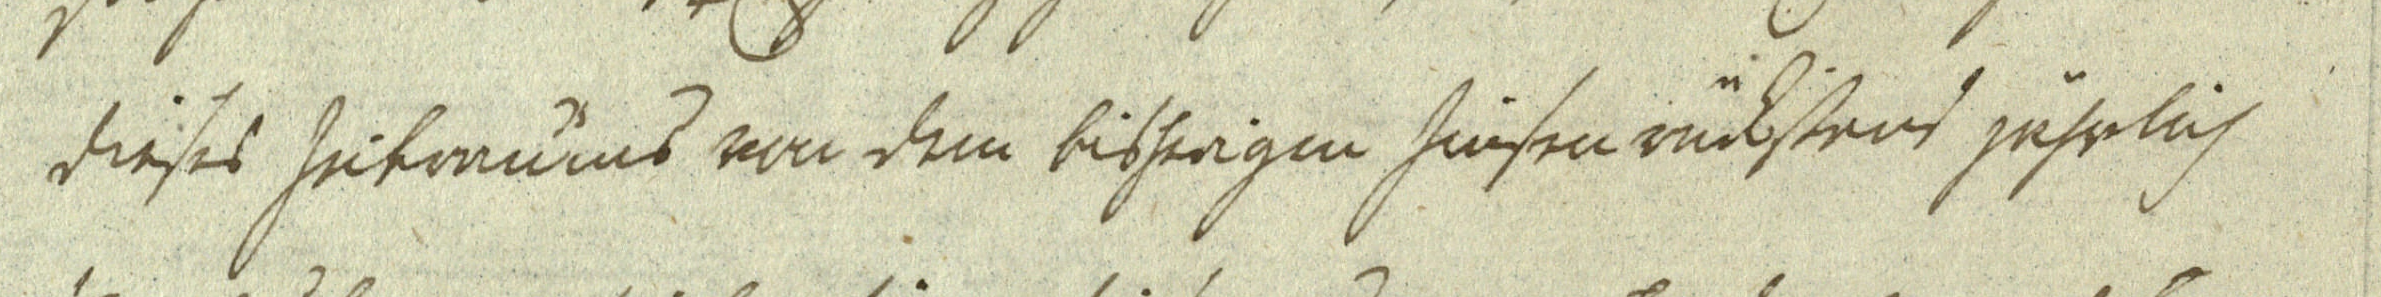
dieses Zeitraums von dem bisherigen Zinsenrückstand jährlich
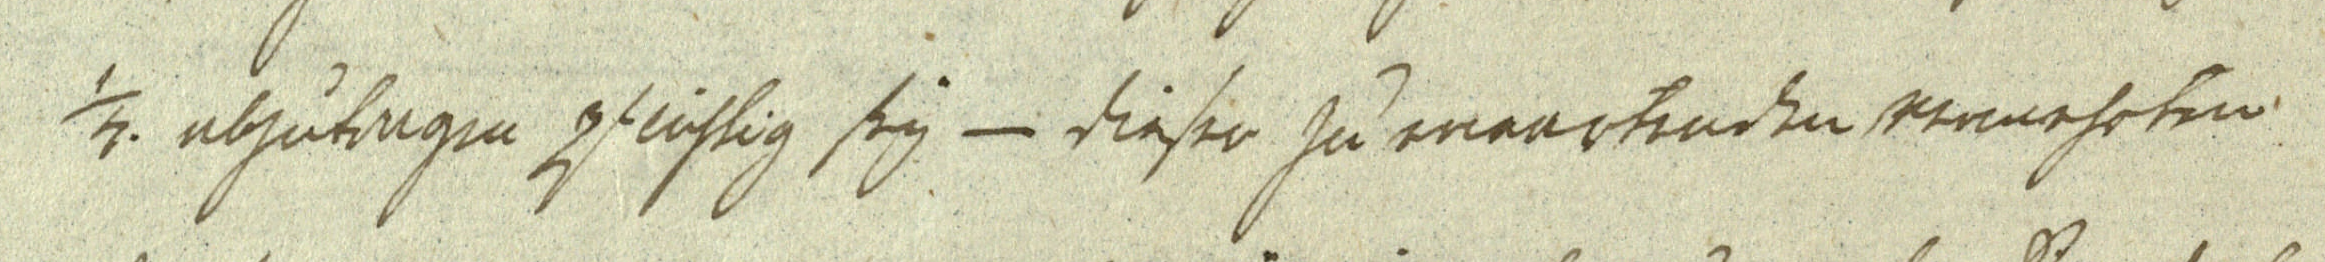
¼. abzutragen pflichtig seÿ - dieser zu erwartenden vermehrten
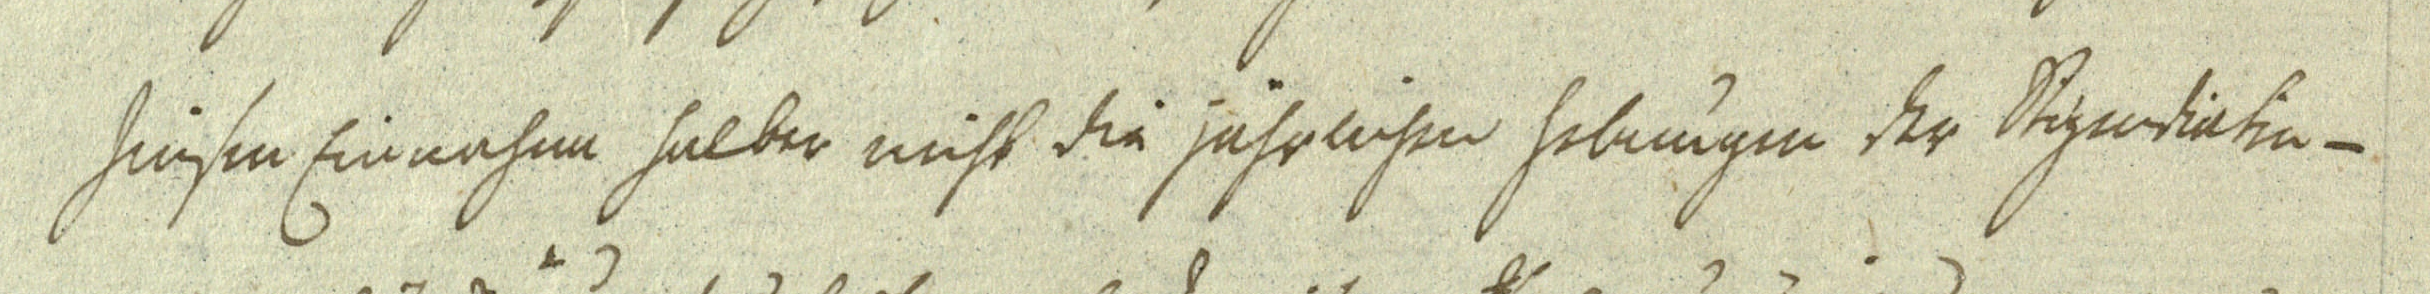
Zinsen Einnahme halber nicht die jährlichen Hebungen der Stipendiaten -
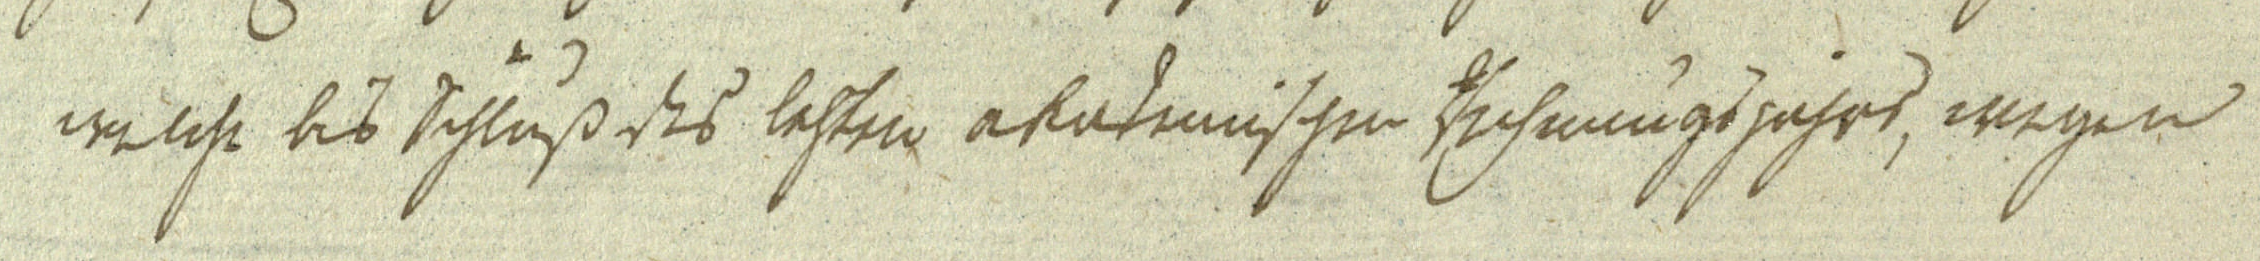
welche bis Schluß des letzten akademischen Rechnungsjahrs, wegen
